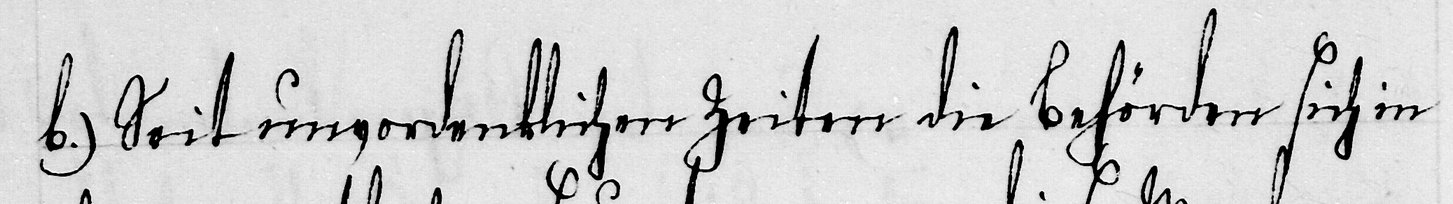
b.) Seit unvordenklichen Zeiten die Behörden sich in
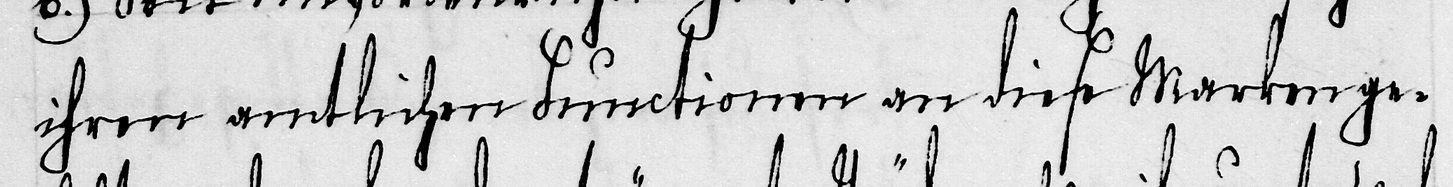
ihren amtlichen Functionen an diese Marken ge¬
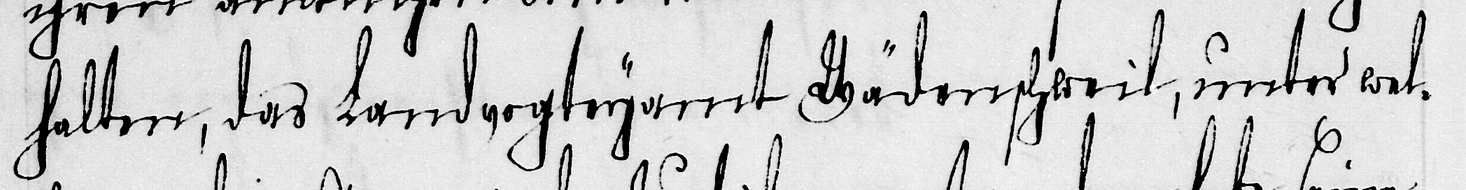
halten, das Landvogteyamt Wädenschweil, unter wel¬
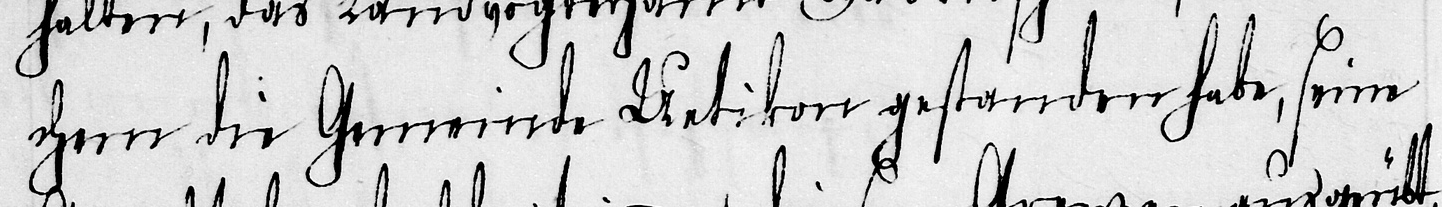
chem die Gemeinde Uetikon gestanden habe, seine
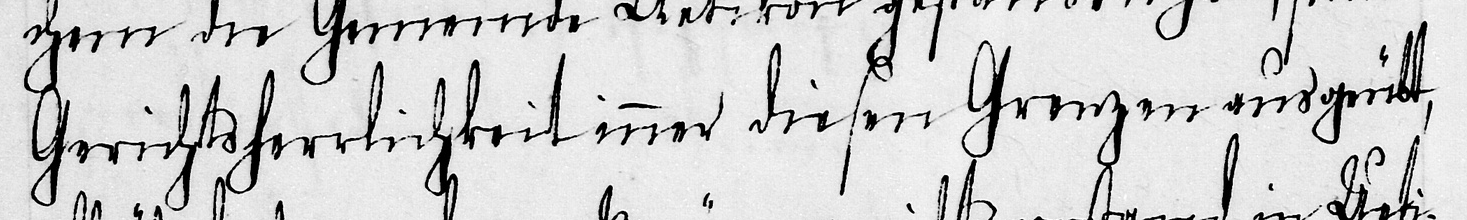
Gerichtsherrlichkeit inner diesen Grenzen ausgeübt,
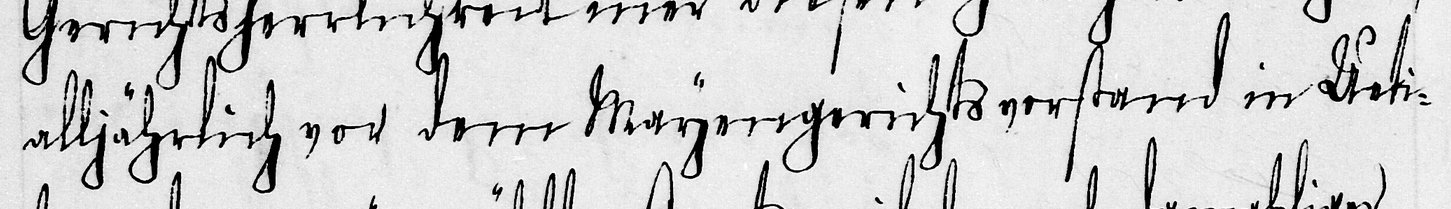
alljährlich vor dem Mayengerichtsvorstand in Ueti¬
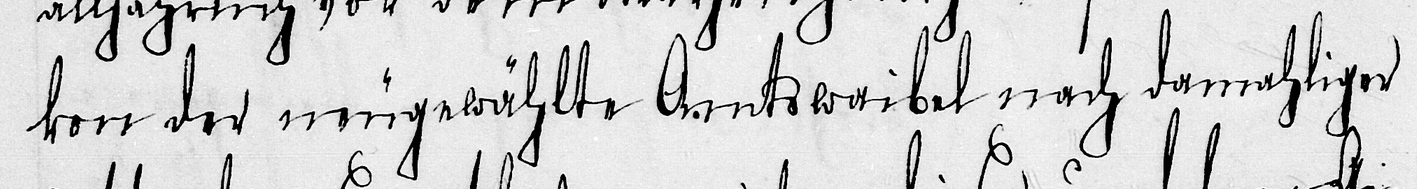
kon der neugewählte Amtswaibel nach damahliger
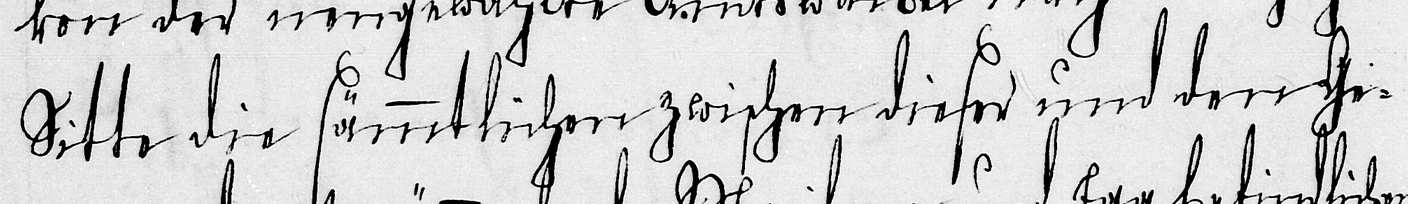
Sitte die sämmtlichen zwischen dieser und den Ge¬
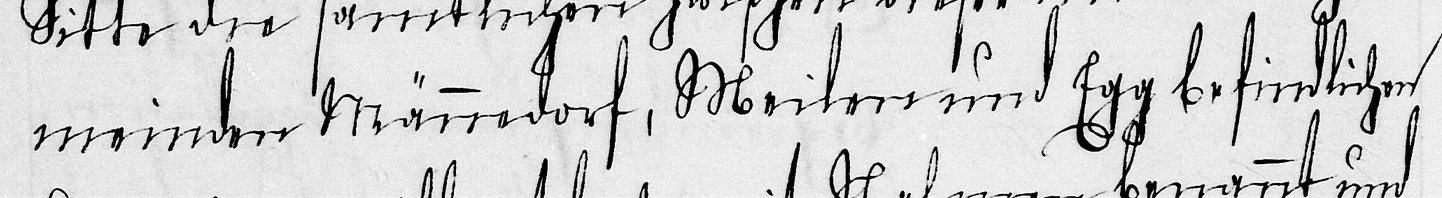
meinden Männedorf, Meilen und Egg befindlichen
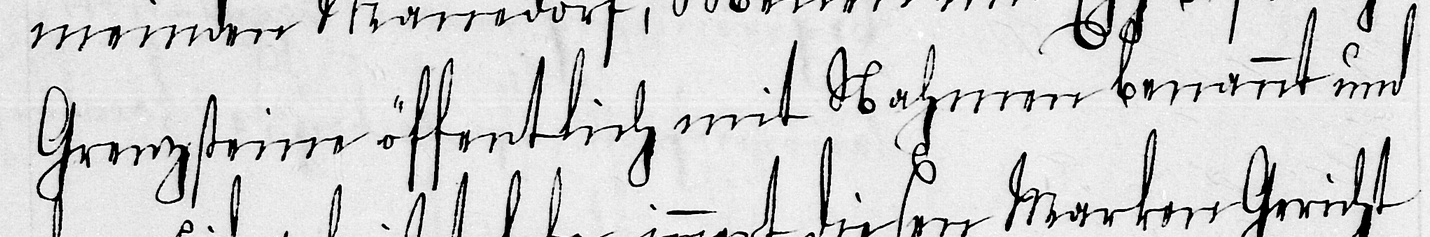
Grenzsteine öffentlich mit Nahmen benannt und
